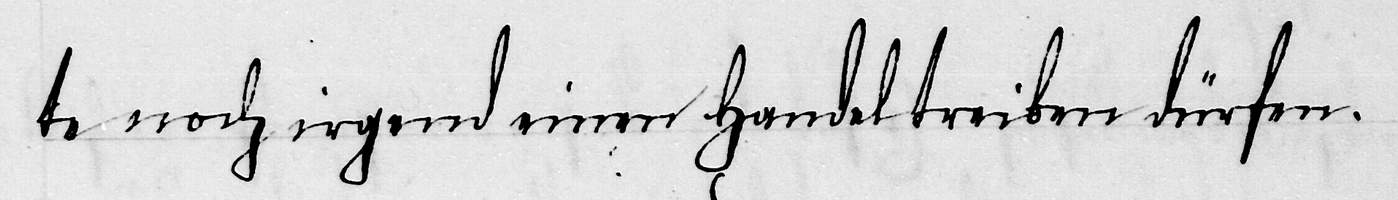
te noch irgend einen Handel treiben dürfen.
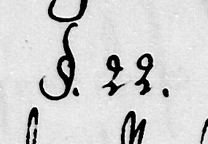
§. 22.
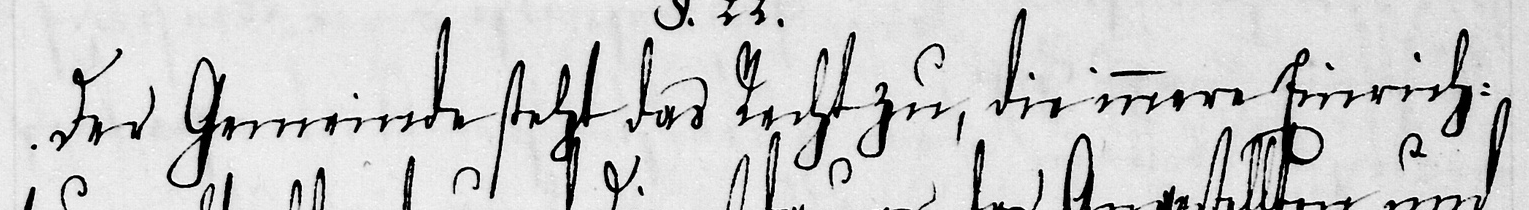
Der Gemeinde steht das Recht zu, die innere Einrich¬
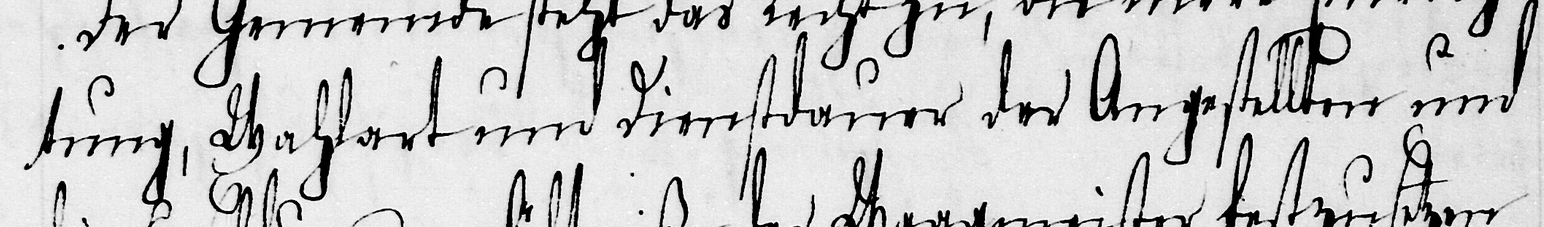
tung, Wahlart und Dienstdauer der Angestellten und
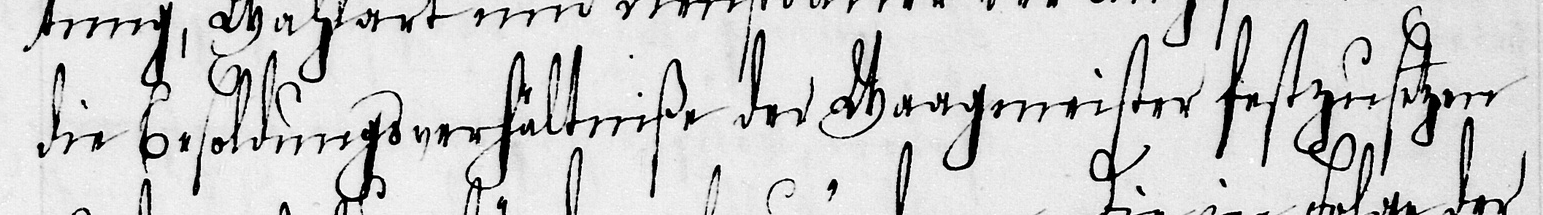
die Besoldungsverhältniße der Waagmeister festzusetzen
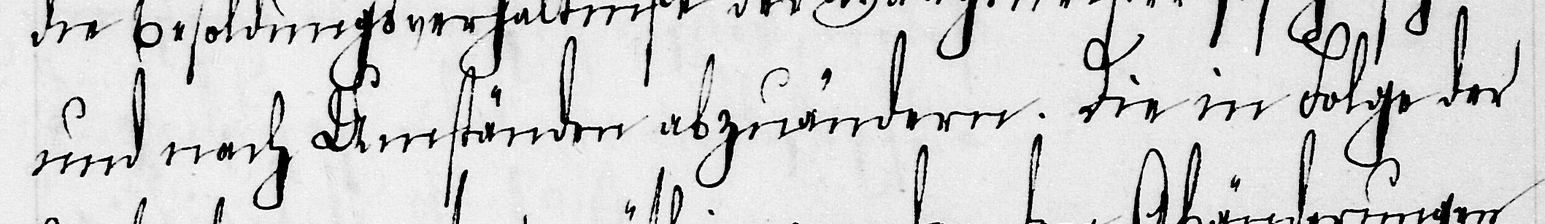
und nach Umständen abzuändern. Die in Folge der
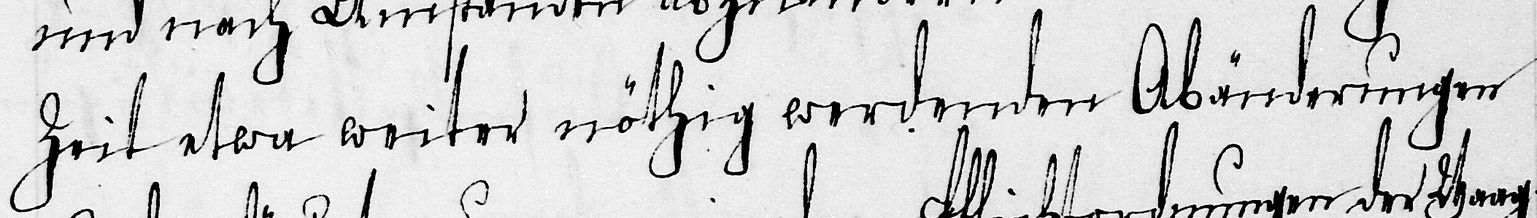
Zeit etwa weiter nöthig werdenden Abänderungen
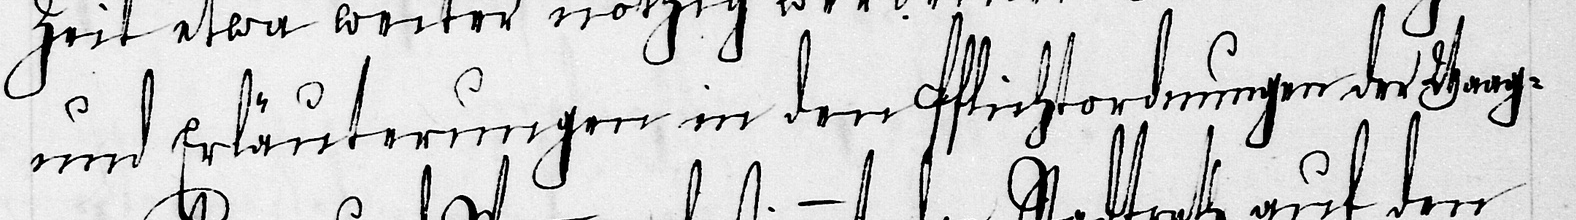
und Erläuterungen in den Pflichtordnungen der Waag¬
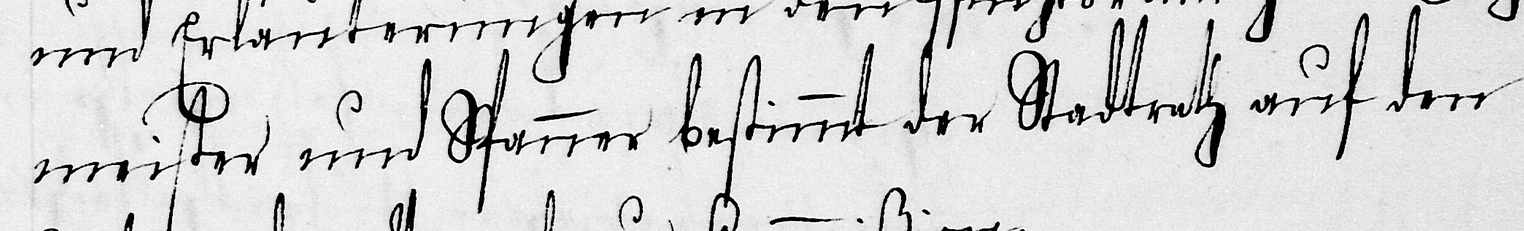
meister und Spanner bestimmt der Stadtrath auf den
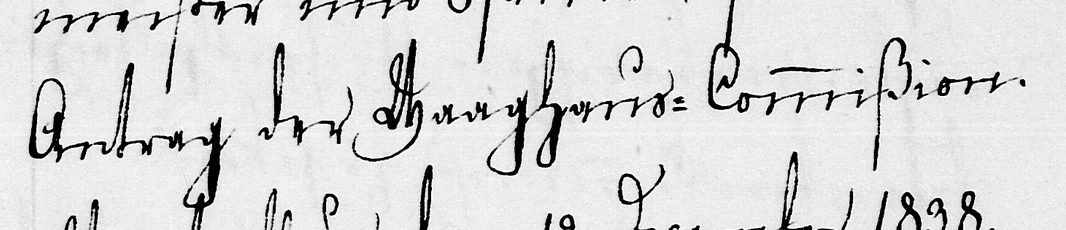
Antrag der Waaghaus-Commißion.
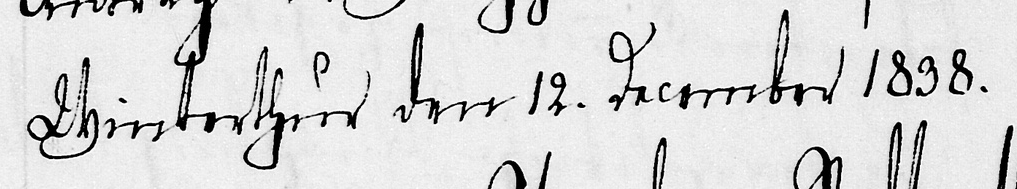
Winterthur den 12. December 1838.
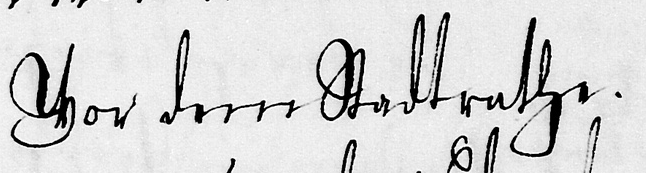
Vor dem Stadtrathe.
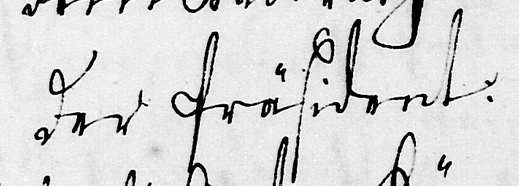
Der Präsident:
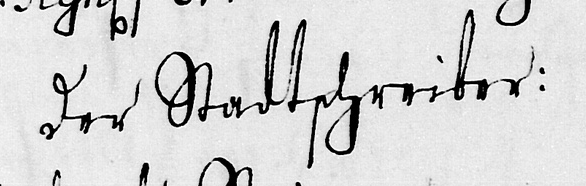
Der Stadtschreiber:
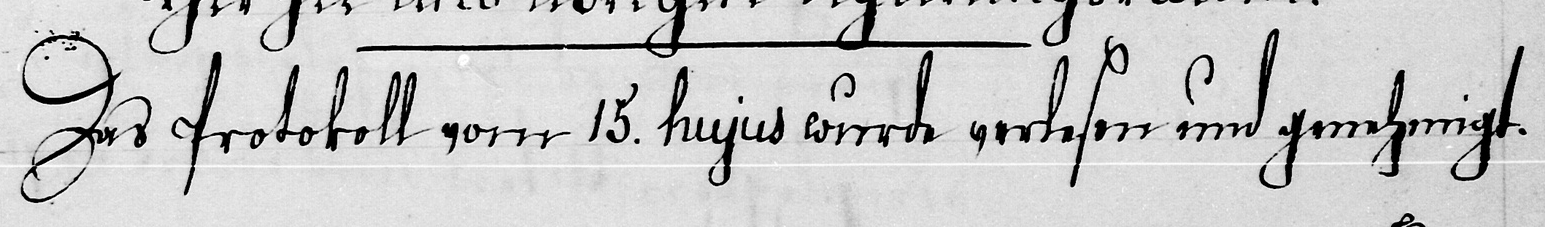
Das Protokoll vom 15. hujus wurde verlesen und genehmigt.
